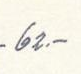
62
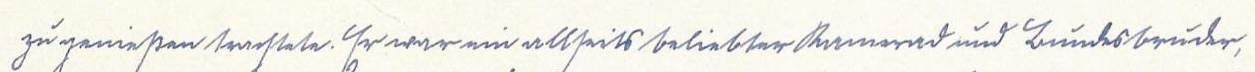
zu genießen trachtete. Er war ein allseits beliebter Kamerad und Bundesbruder,
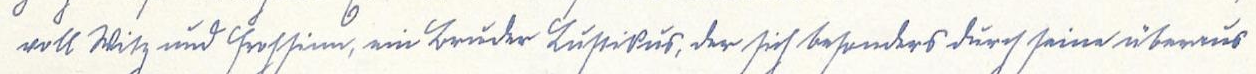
voll Witz und Frohsinn, ein Bruder Luftikus, der sich besonders durch seine überaus
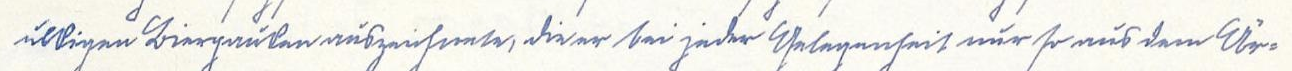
ulkigen Bierpauken auszeichnete, die er bei jeder Gelegenheit nur so aus dem Är-
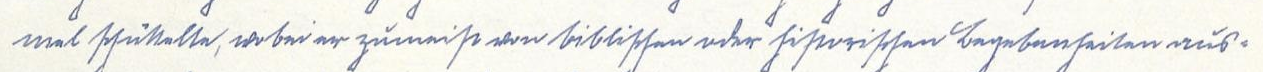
mel schüttelte, wobei er zumeist von biblischen oder historischen Gegebenheiten aus-
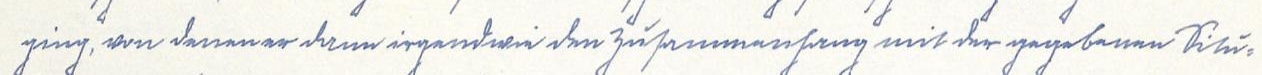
ging, von denen er dann irgendwie im Zusammenhang mit der gegebenen Situ-
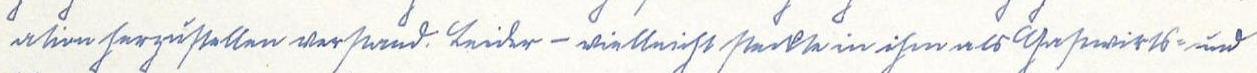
ation herzustellen verstand. Leider-vielleicht steckte in ihm als Gastwirts- und
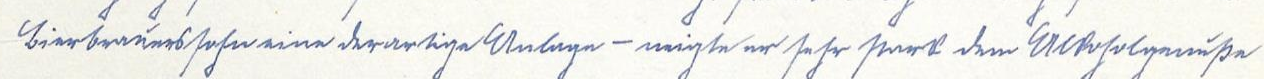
Bierbrauersohn eine derartige Anlage-neigte er sehr stark dem Alkoholgenuße
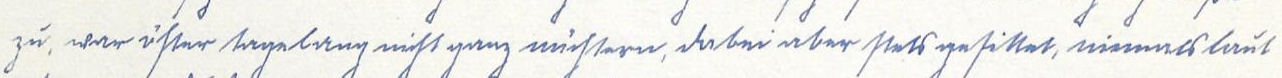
zu, war öfter tagelang nicht ganz nüchtern, dabei aber stets gesittet, niemals laut
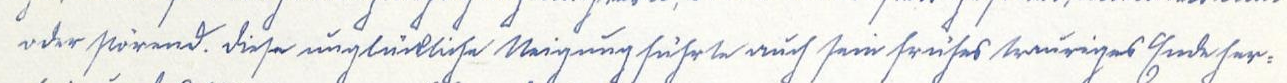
oder störend. Diese unglückliche Neigung führte auch sein frühes trauriges Ende her-
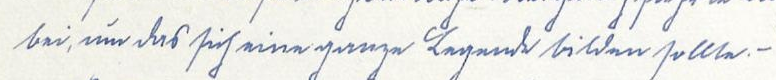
bei, um das sich eine ganze Legende bilden sollte.-
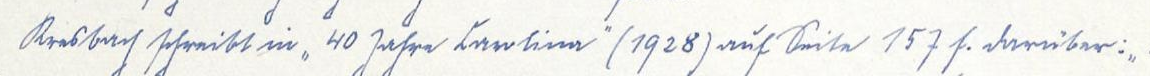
Kresbach schrieb in „40 Jahre Carolina“ (1928) auf Seite 157 f. darüber: „…
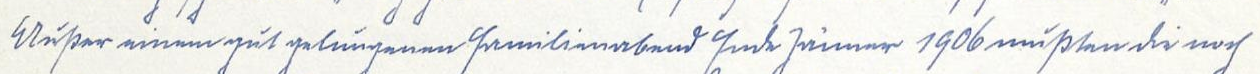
Außer einem gut gelungenen Familienabend Ende Jänner 1906 mußten die noch
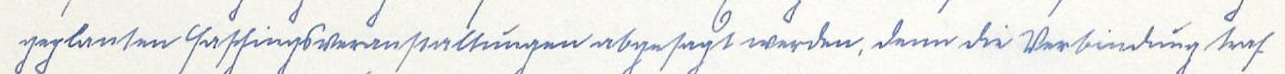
geplanten Faschingsveranstaltungen abgesagt werden, der die Verbindung traf
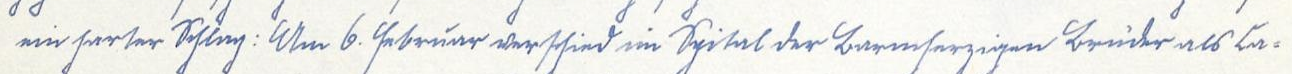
ein harter Schlag: Am 6. Februar verschiedentlich der Barmherzigen Brüder als Ca-
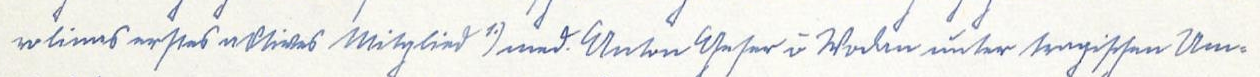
rolines erstes aktives Mitglied 1) med. Anton Geser v/p Wodan unter tragischen Um-
